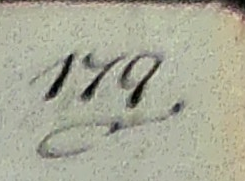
179.
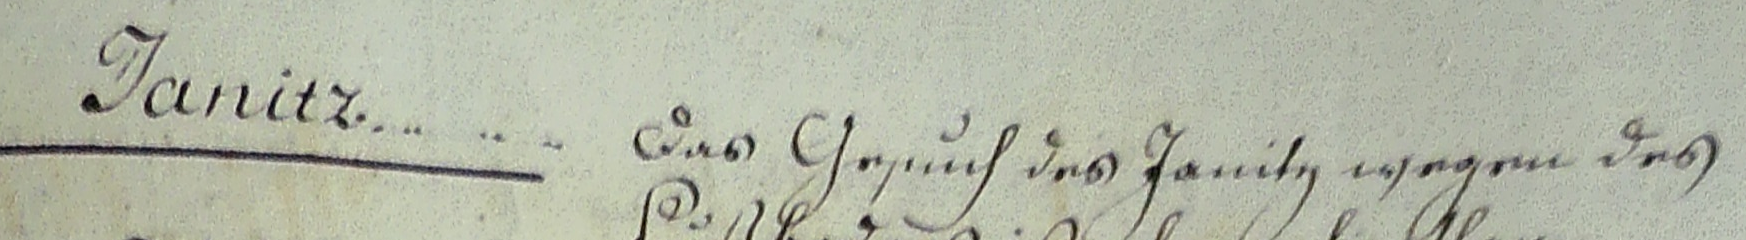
Janitz. .. .. .. Das Gesuch des Janitz wegen des
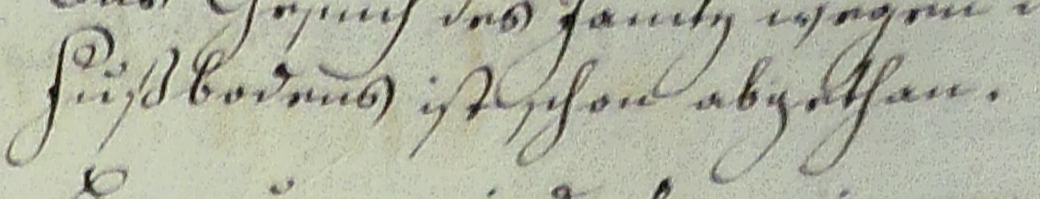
Fußbodens ist schon abgethan.
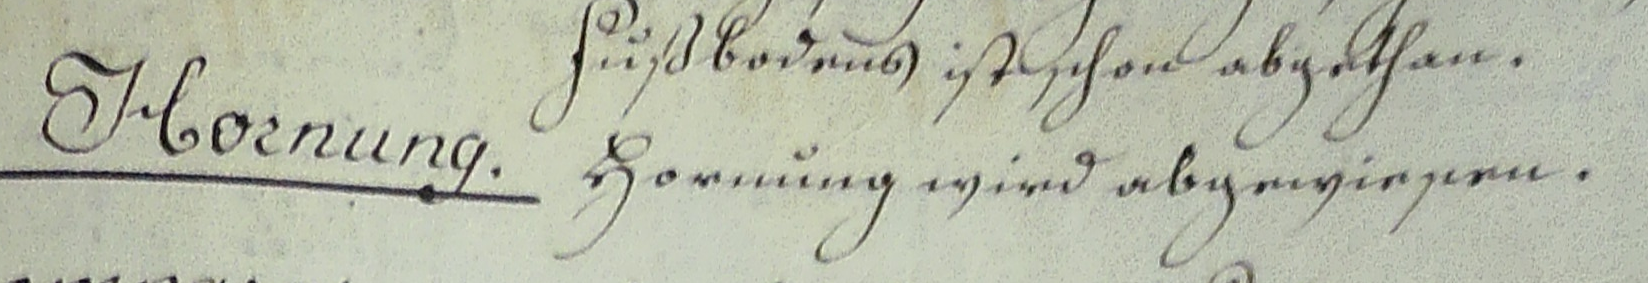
Hornung. Hornung wird abgewiesen.
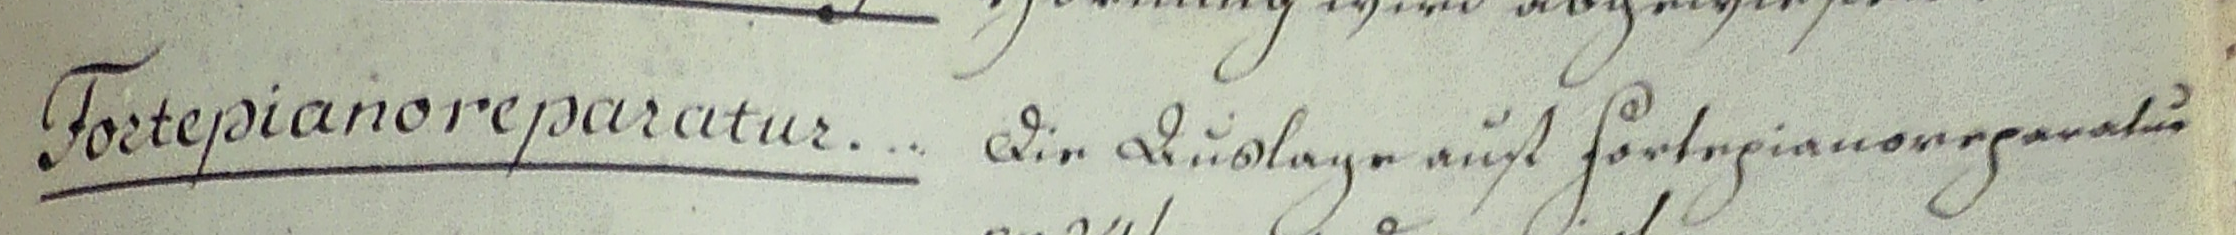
Fortepianoreparatur. . . Die Auslage auf Fortepianoreparatur
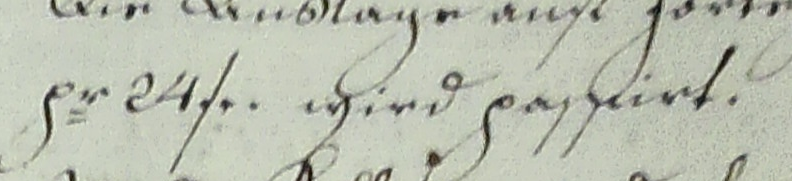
pr͇ 24fr. wird passirt.
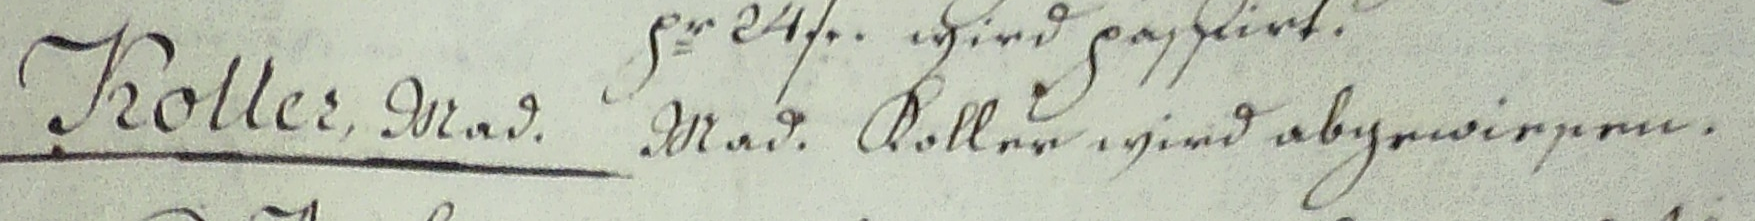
Koller, Mad. Mad. Koller wird abgewiesen.
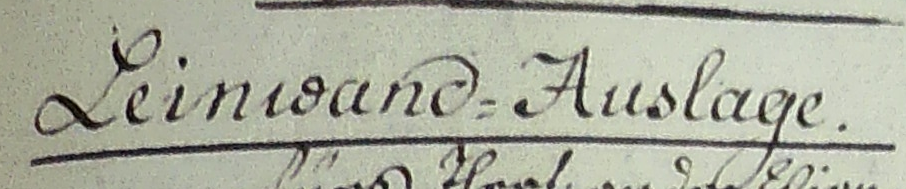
Leinwand=Auslage.
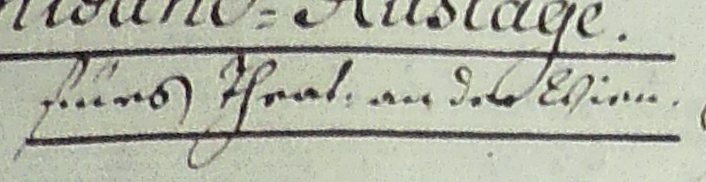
fürs Teather an der Wien.
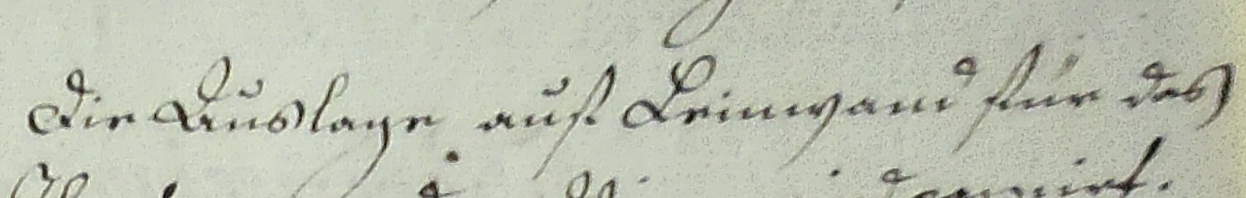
Die Auslage auf Leinwand für das
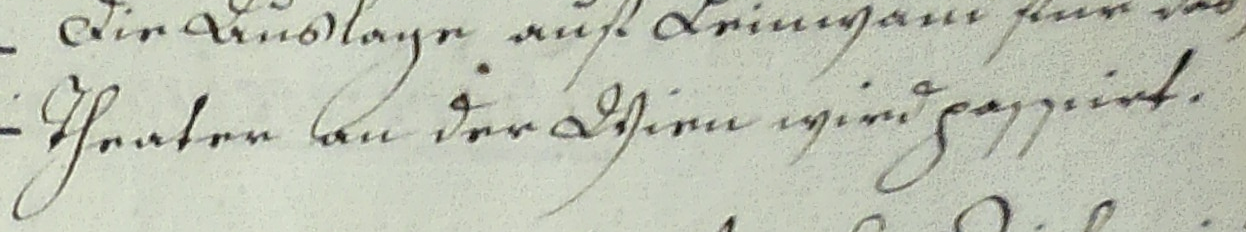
Theater an der Wien wird passirt.
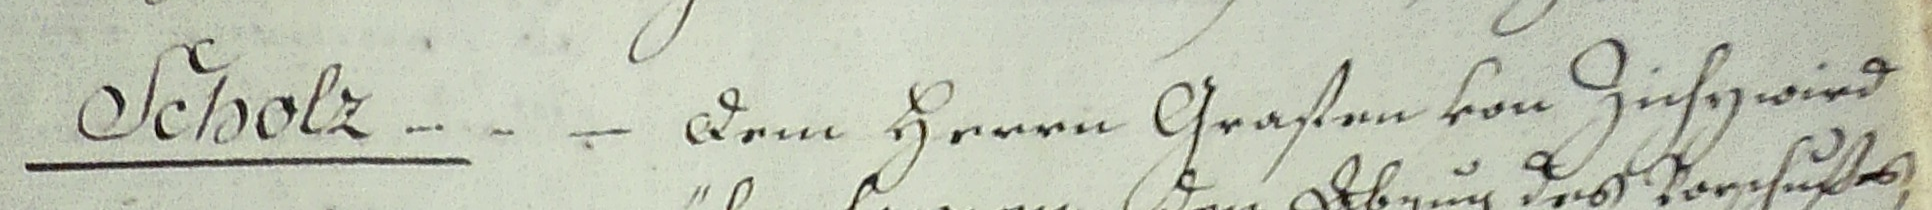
Scholz _ _ _ Dem Herrn Grafen von Zichy wird
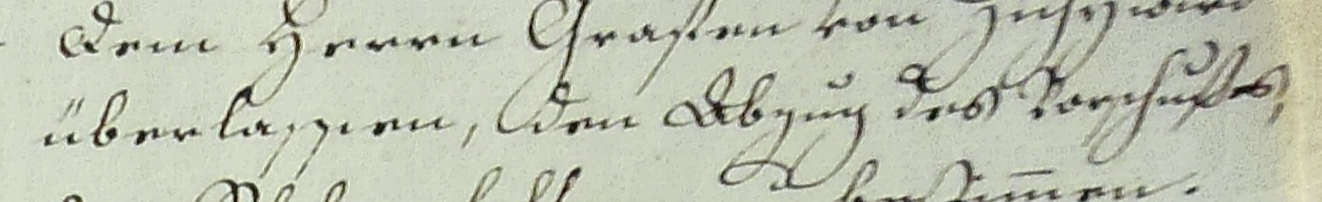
überlassen, den Abzug des Vorschußes
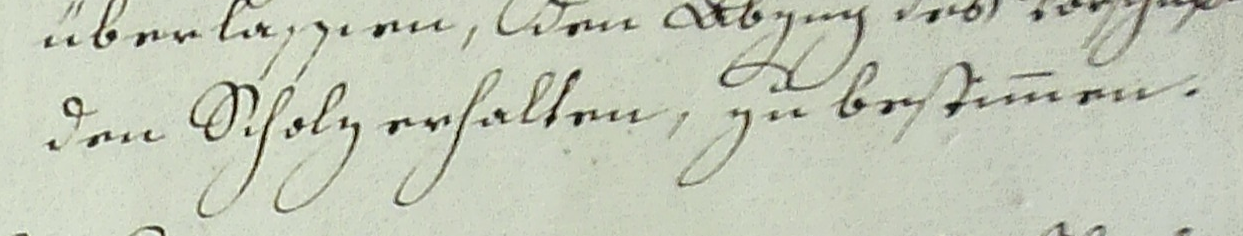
den Scholz erhalten, zu bestim̅en.
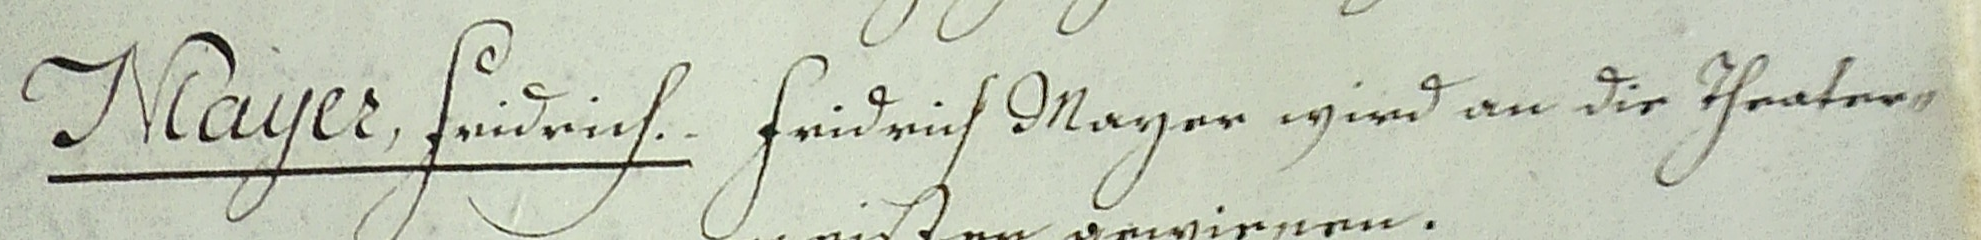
Mayer, Fridrich. . Fridrich Mayer wird an die Theater¬
